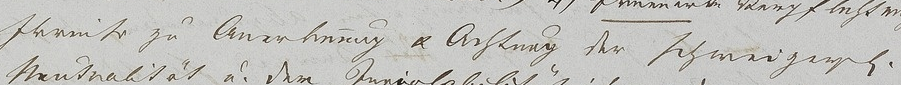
Fkreich zu Anerkennung & Achtung der schweizersch.
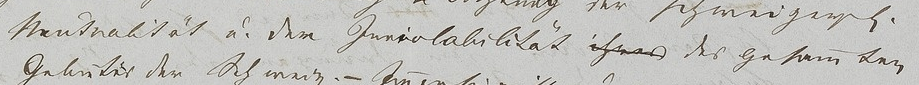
Neutralität u. deren Inviolabilität ihres des gesammten
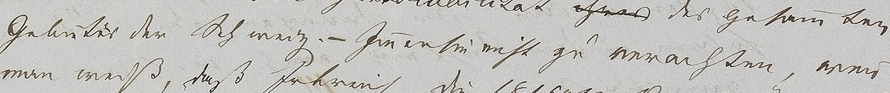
Gebietes der Schweiz. – Immerhin nicht zu verachten, wenn
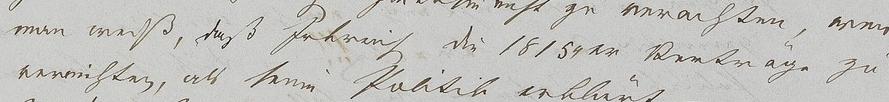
man weiß, daß Frkreich die 1815-er Verträge zu
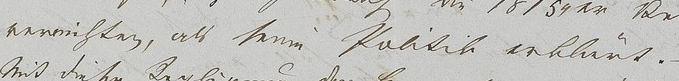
vernichten, als seine Politik erklärt. –
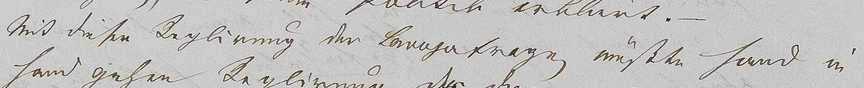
Mit dieser Reglirung der Savoyer frage, müßte Hand in
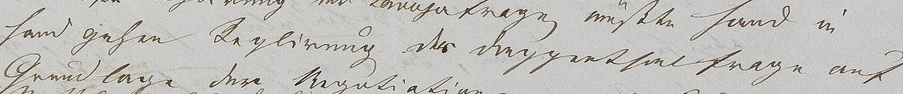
Hand gehen Reglirung der Dappenthalfrage auf
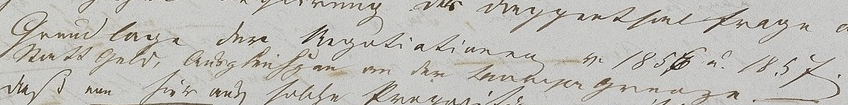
Grundlage der Negotiationen v. 1856 u. 1857. –
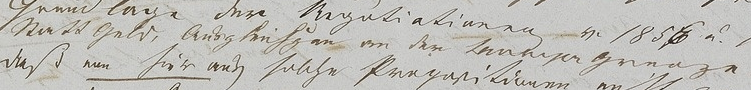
Statt Geld, Ausgleichungen an der Savoyer grenze.
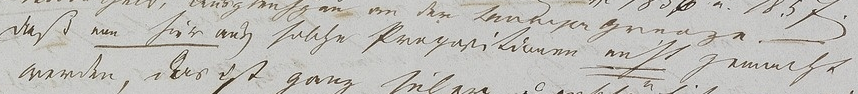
Daß von hier aus solche Propositionen nicht gemacht
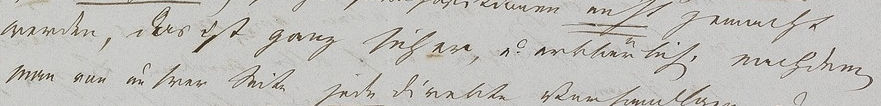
werden, das ist ganz sicher, u. erklärlich, nachdem
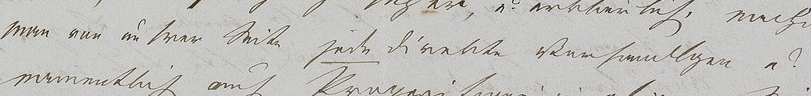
man von unsrer Seite jede direkte Verhandlgen u.
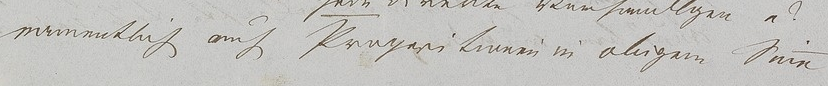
namentlich auch Propositionen in obigem Sinne
